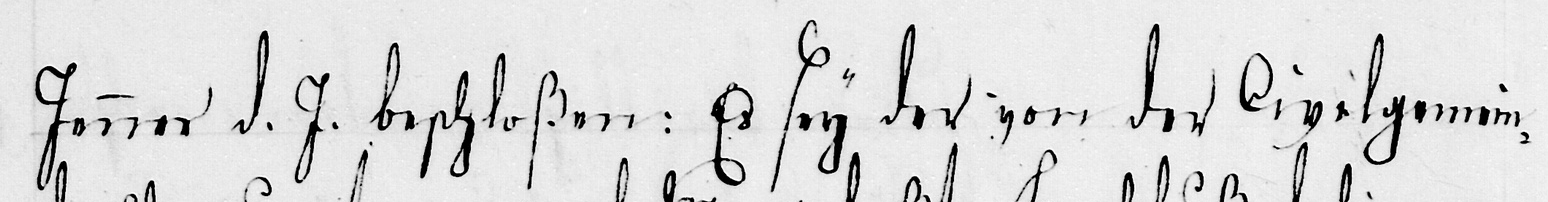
Jenner d. J. beschloßen: Es sey der von der Civilgemei¬
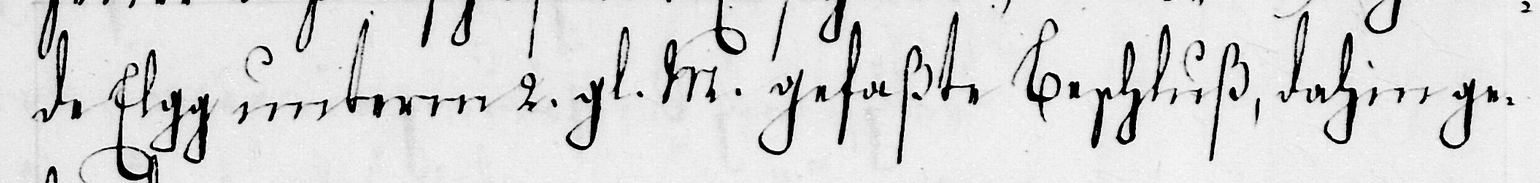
nde Elgg unterm 2. gl. M. gefaßte Beschluß, dahin ge¬
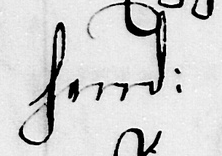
hend:
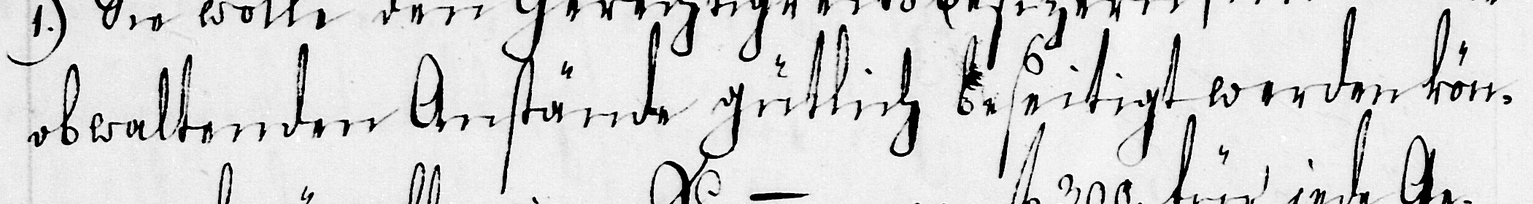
obwaltenden Anstände gütlich beseitigt werden kön¬
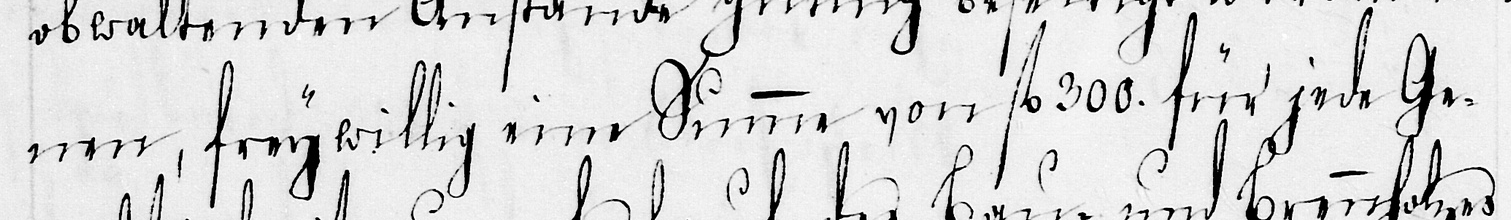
nen, freywillig eine Summe von fl. 300. für jede Ge¬
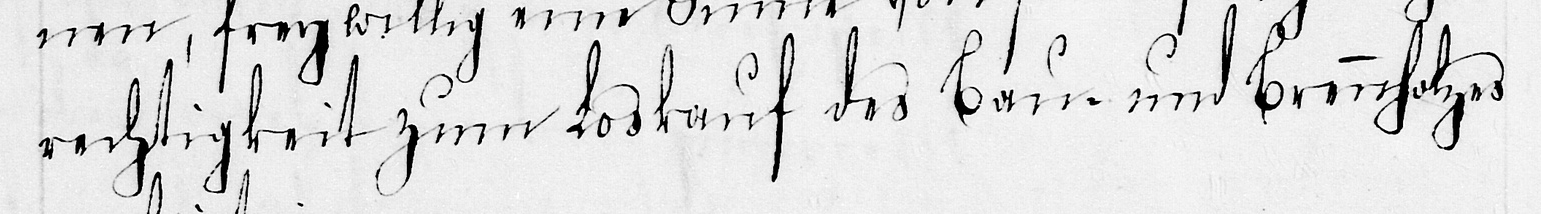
rechtigkeit zum Loskauf des Bau- und Brennholzes
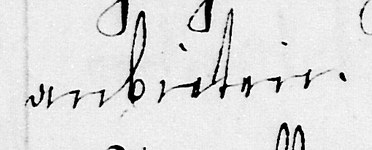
anbieten.
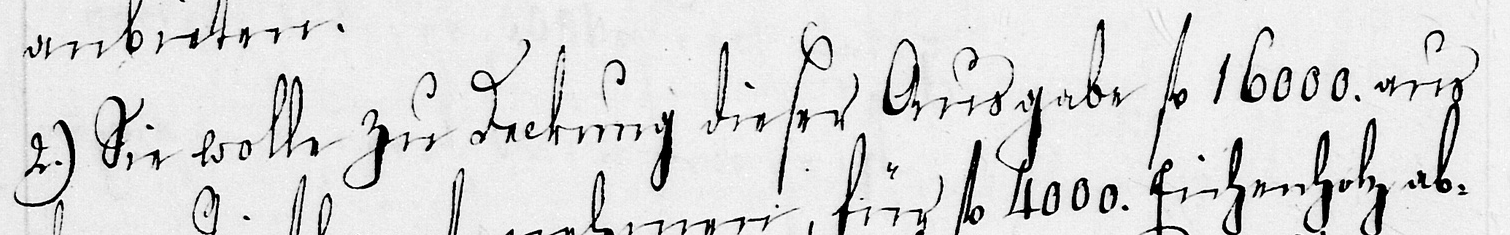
2.) Sie wolle zu Deckung dieser Ausgabe fl. 16000. aus
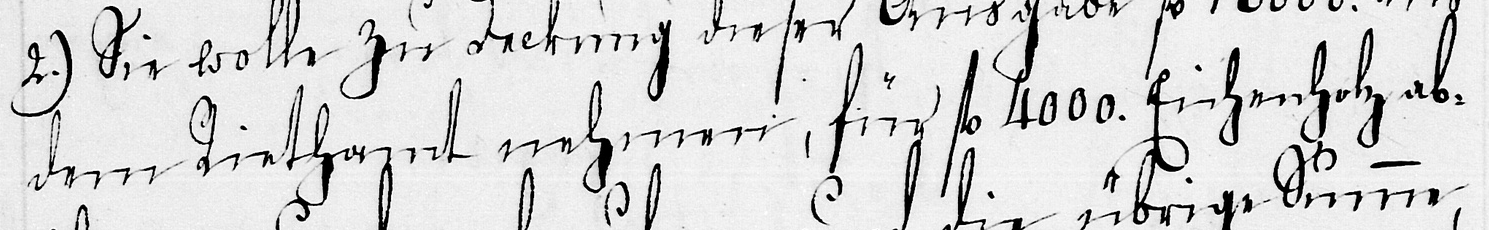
dem Riethamt nehmen, für fl. 4000. Eichenholz ab¬
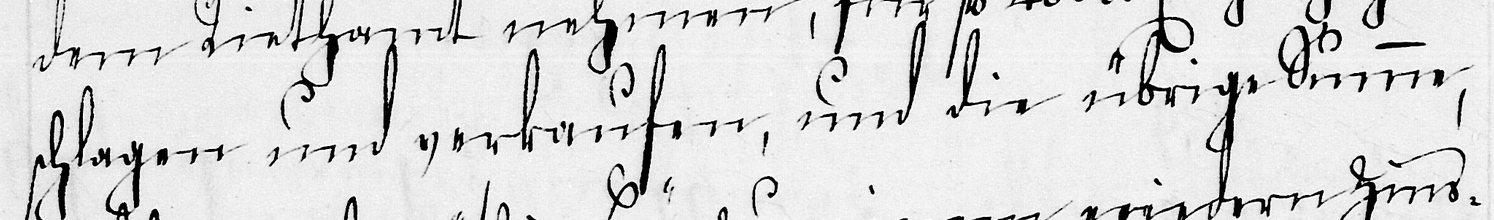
schlagen und verkaufen, und die übrige Summe,
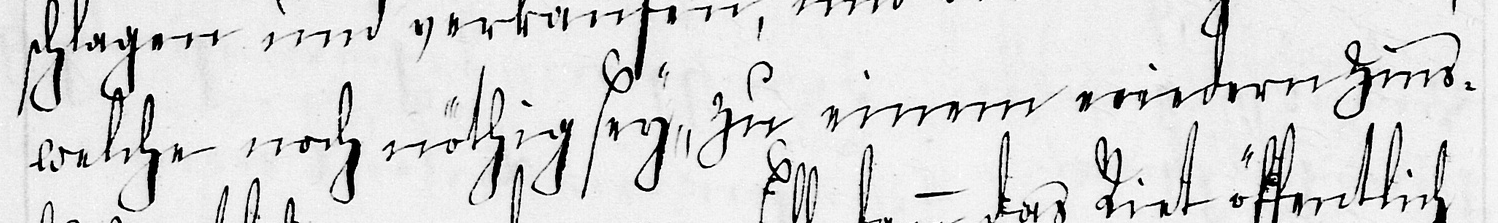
welche noch nöthig sey, zu einem niedern Zins¬
